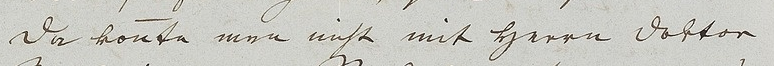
Da konnte man nicht mit Herrn Doktor
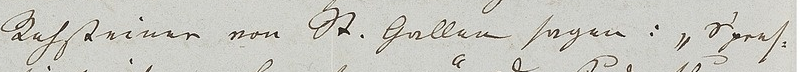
Rehsteiner von St. Gallen sagen: «S'pres-
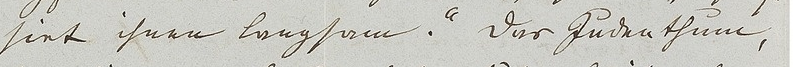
sirt ihnen langsam.» Das Judenthum,
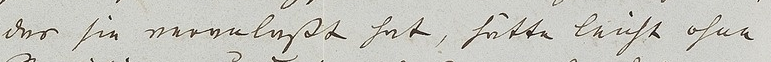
das sie veranlaßt hat, hätte leicht ohne
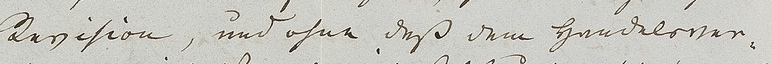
Revision, und ohne daß dem Handelsver-
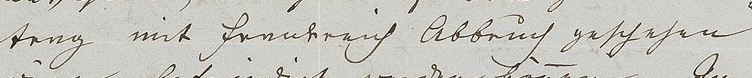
trag mit Frankreich Abbruch geschehen
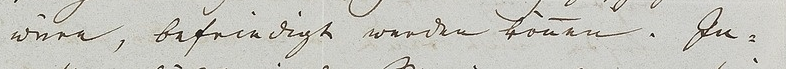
wäre, befriedigt werden können. In-
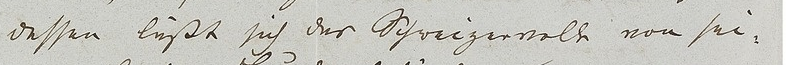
dessen läßt sich das Schweizervolk von sei-
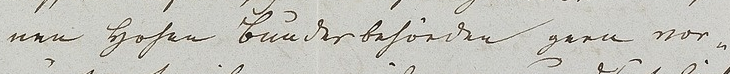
ner Hohen Bundesbehörde gern vor-
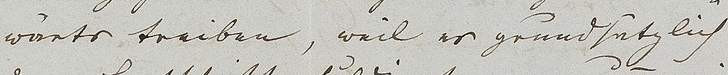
wärts treiben, weil es grundsätzlich
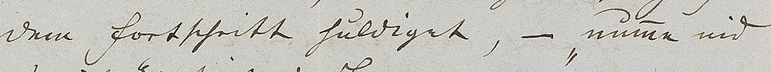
dem Fortschritt huldiget, – «numme nid
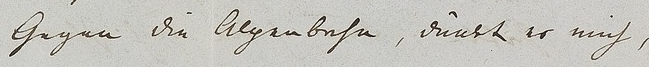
Gegen die Alpenbahn, dunkt es mich,
